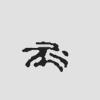帀
